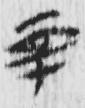辛
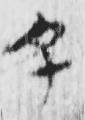丑
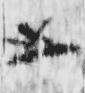之
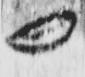日
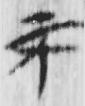不
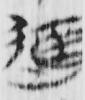𬨭（將）
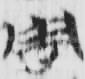周
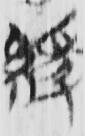緩
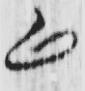㠯（以）
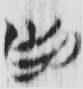○（廷）
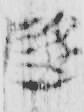阩
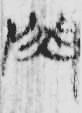門
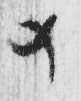又
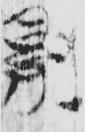敗
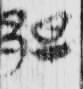○（旦）
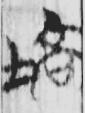塙
